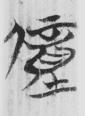僮
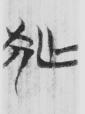{犬亡}
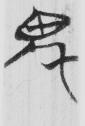鬼
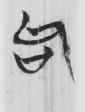句
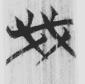{戈戈}
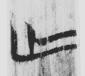亡
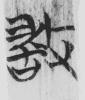敢
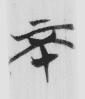不
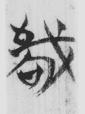{苟戈}
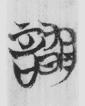詢
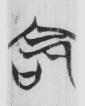命
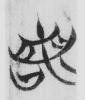若
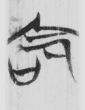命
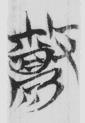{㐭泉攴}
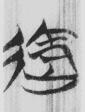御
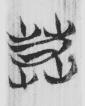莫
